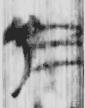於
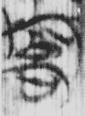喬
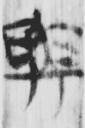與
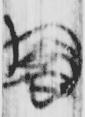喬
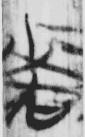差
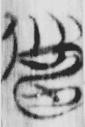○（僕）
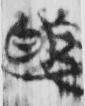受
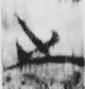之
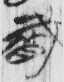戠
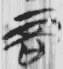言
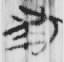市
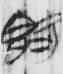既
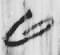㠯（以）
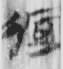○（返）
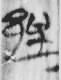郢
